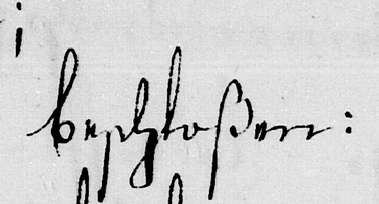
beschloßen:
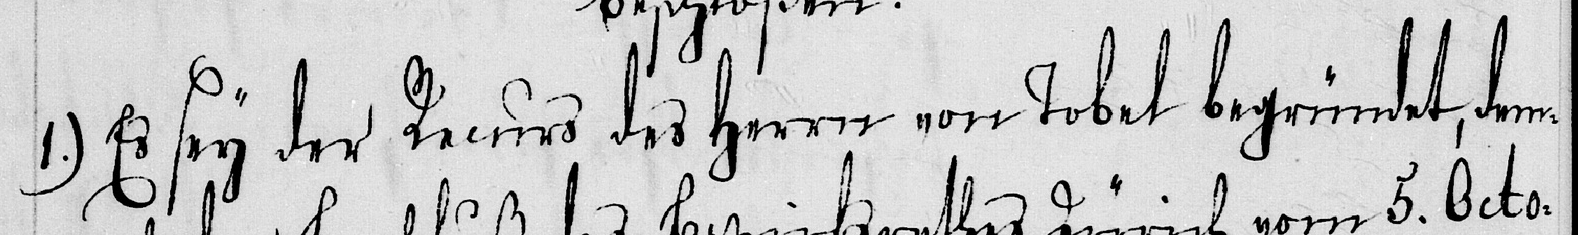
Es sey der Recurs des Herrn von Tobel begründet, d¬
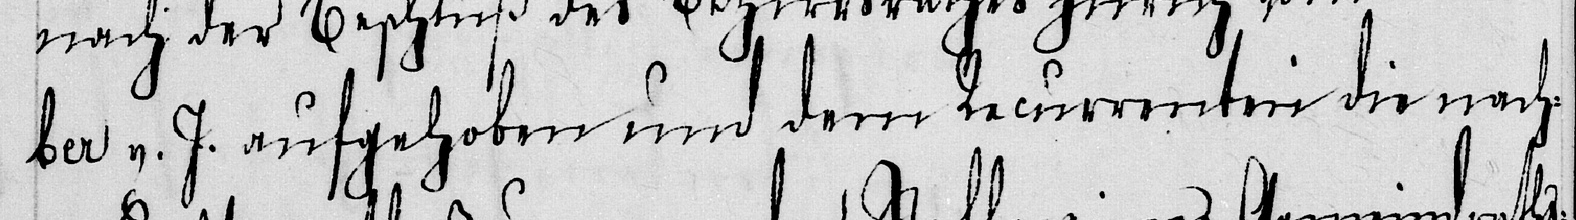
ber v. J. aufgehoben und dem Recurrenten die nach¬
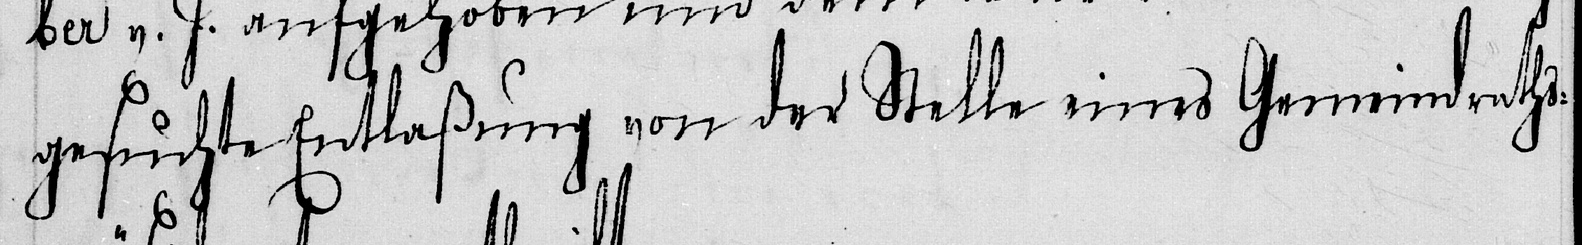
gesuchte Entlaßung von der Stelle eines Gemeindraths¬
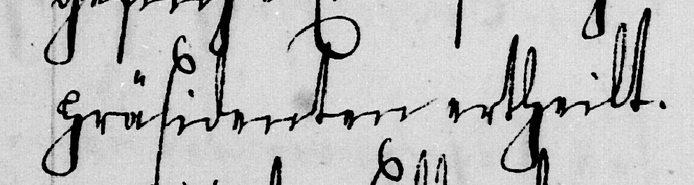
präsidenten ertheilt.
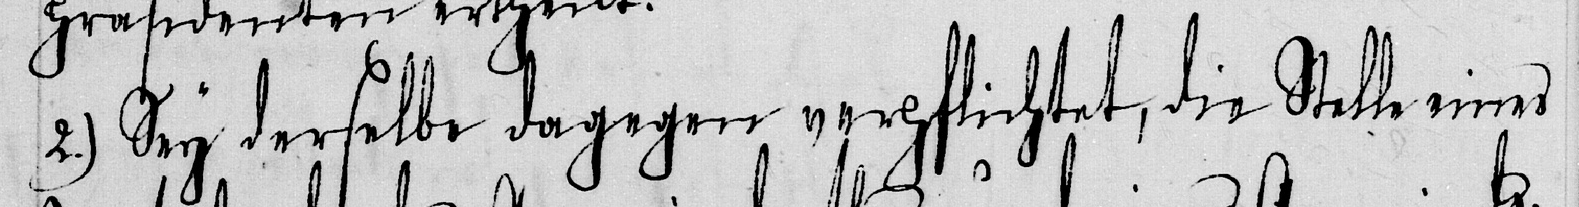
2.) Sey derselbe dagegen verpflichtet, die Stelle eines
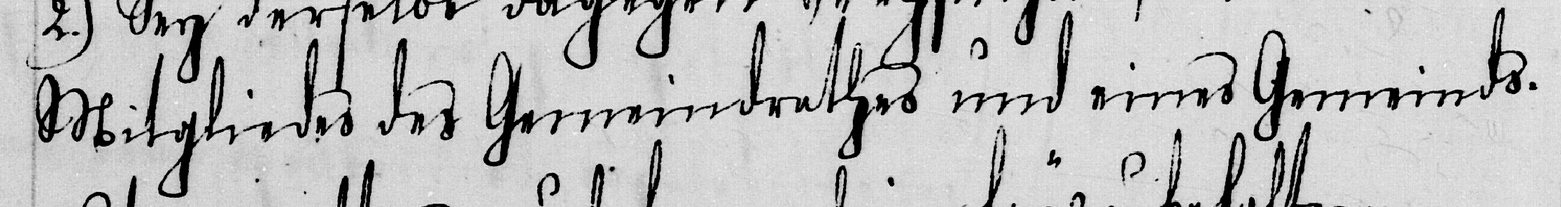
Mitgliedes des Gemeindrathes und eines Gemeinds¬
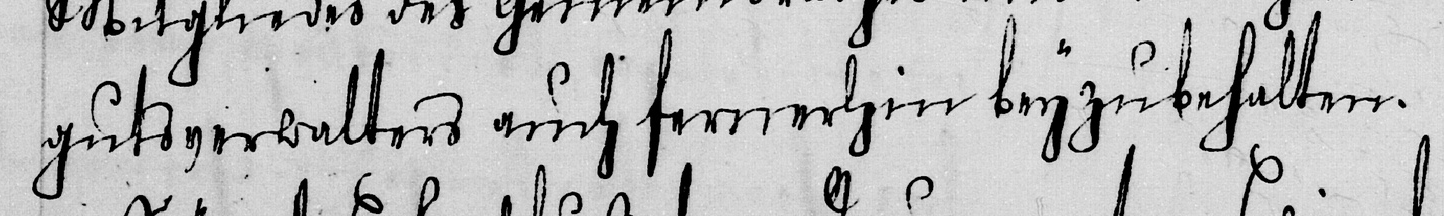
gutsverwalters auch fernerhin beyzubehalten.
